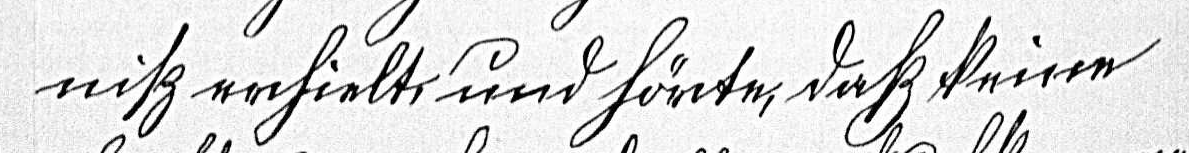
niß erhielt, und hörte, daß keine
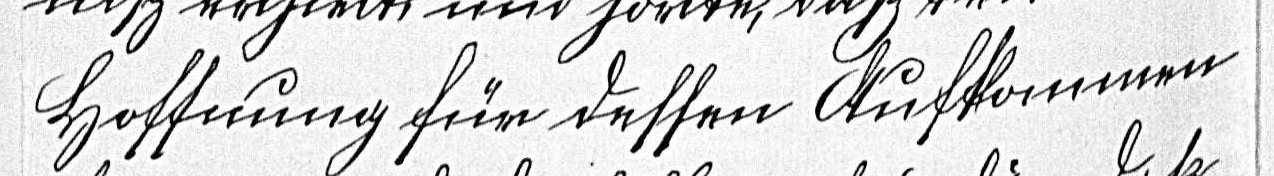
Hoffnung für dessen Aufkommen
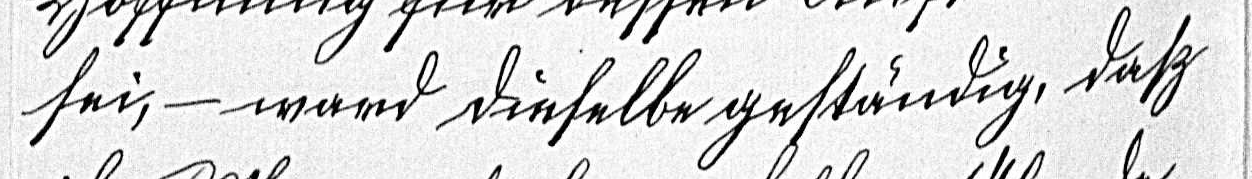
sei, -- ward dieselbe geständig, daß
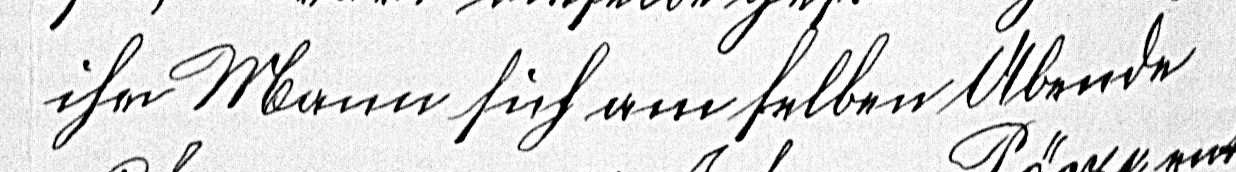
ihr Mann sich am selben Abende
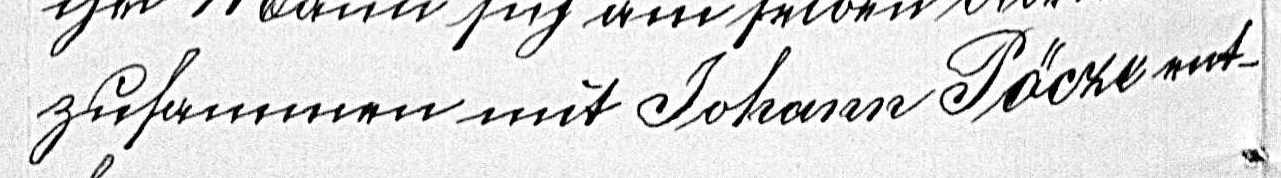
zusammen mit Johann Pöcze ent¬
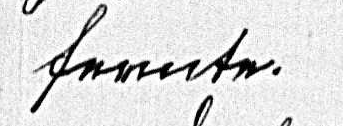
fernte.
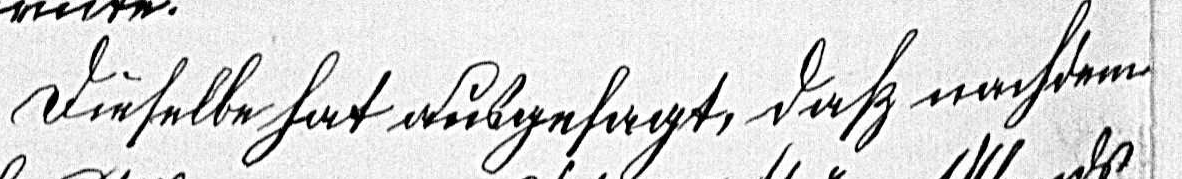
Dieselbe hat ausgesagt, daß nachdem
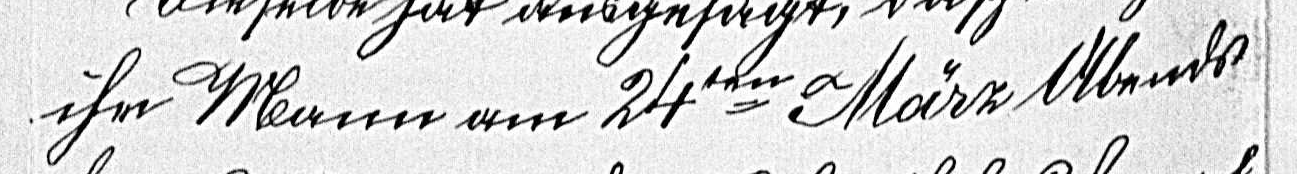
ihr Mann am 24ten März Abends
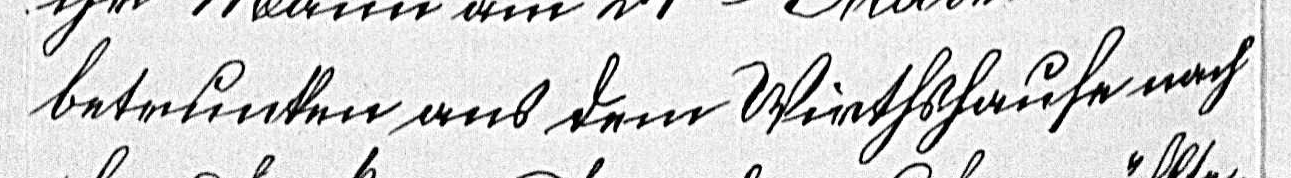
betrunken aus dem Wirthshause nach
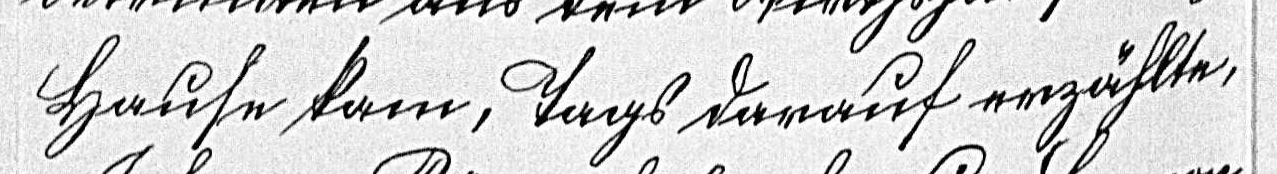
Hause kam, tags darauf erzählte,
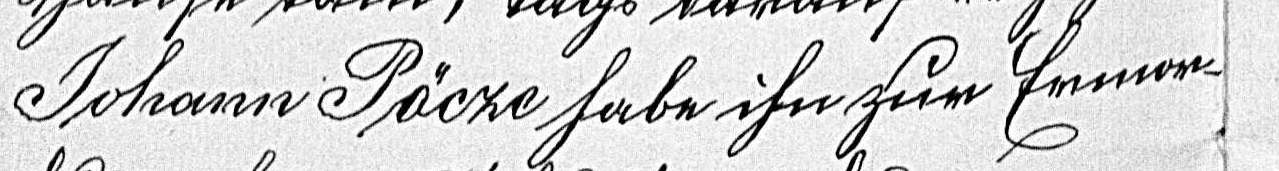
Johann Pöcze habe ihn zur Ermor¬
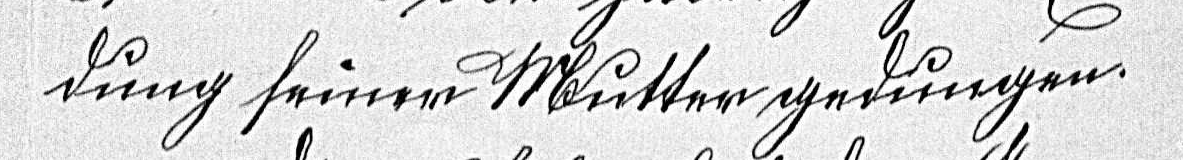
dung seiner Mutter gedungen.
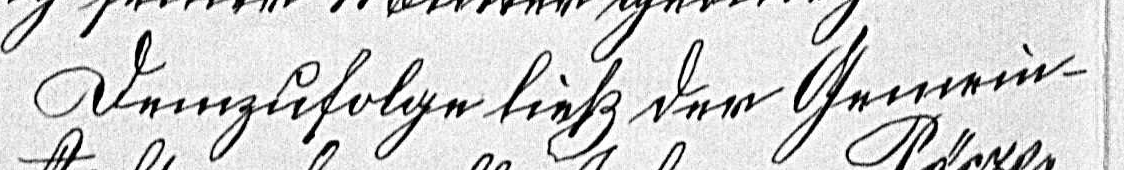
Demzufolge ließ der Gemein¬
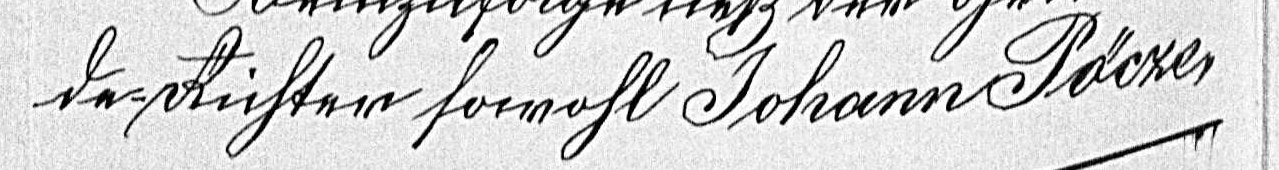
de Richter sowohl Johann Pöcze
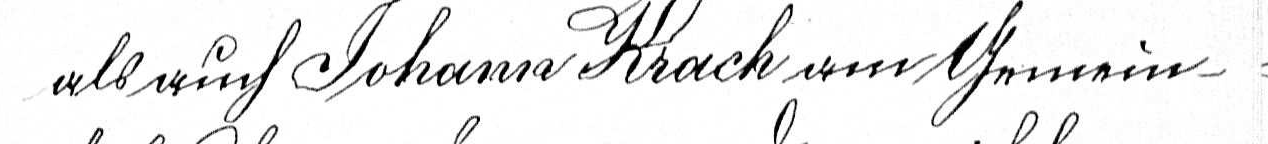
als auch Johann Krach am Gemein¬
